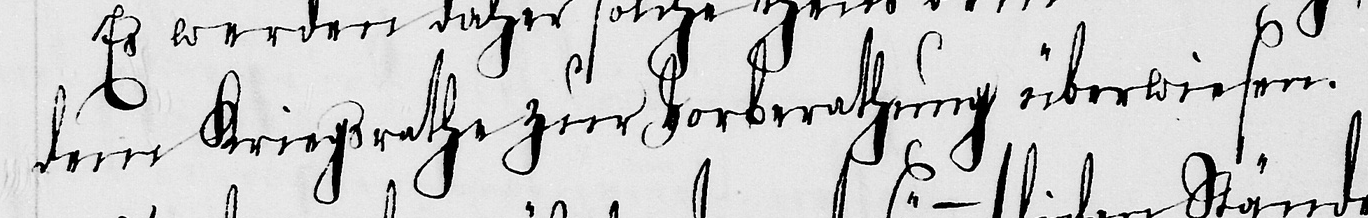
dem Kriegsrathe zur Vorberathung überwiesen.
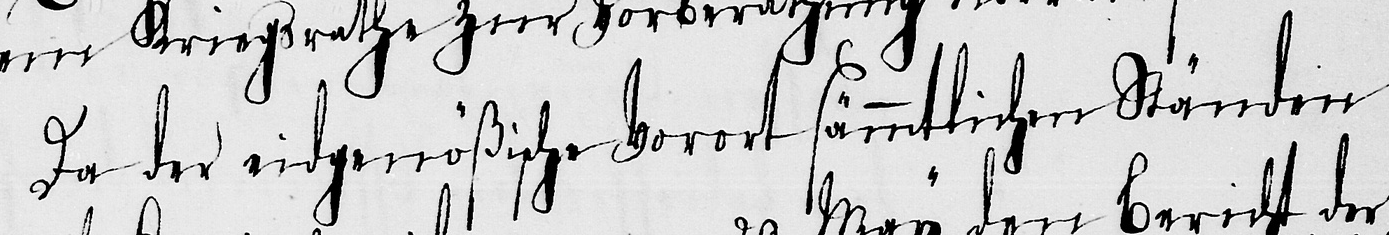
Da der eidgenößische Vorort sämmtlichen Ständen
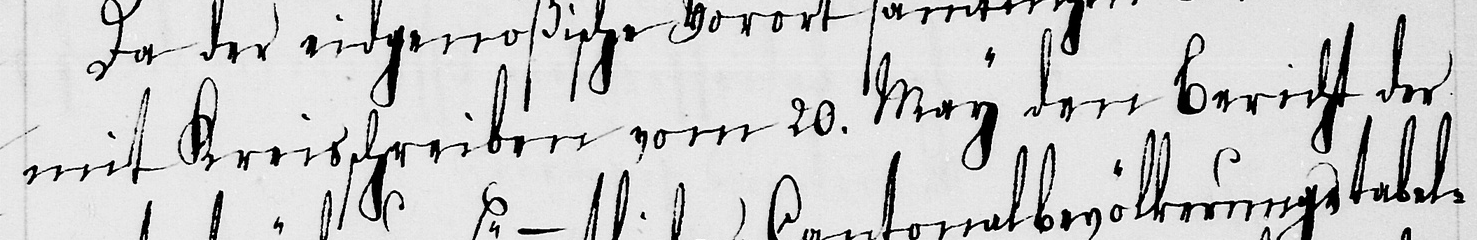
mit Kreisschreiben vom 20. May den Bericht der
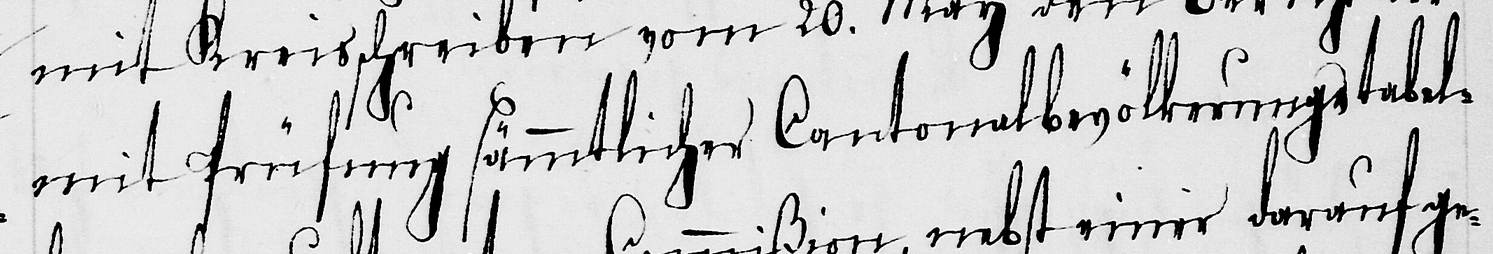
mit Prüfung sämmtlicher Cantonalbevölkerungstabel¬
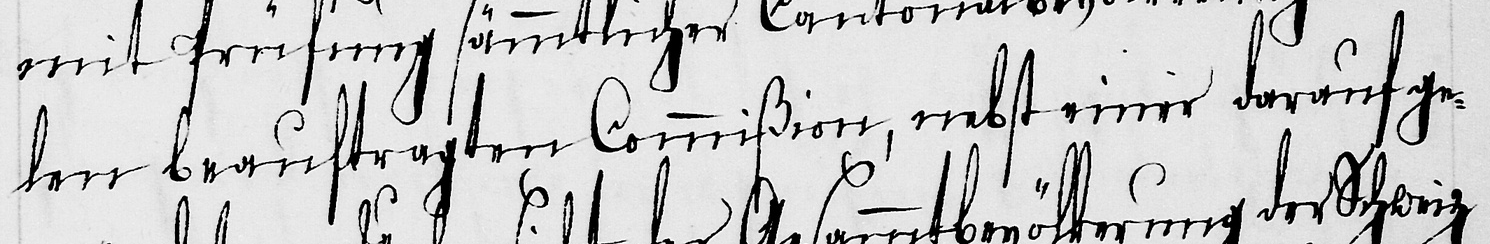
len beauftragten Commißion, nebst einer darauf ge¬
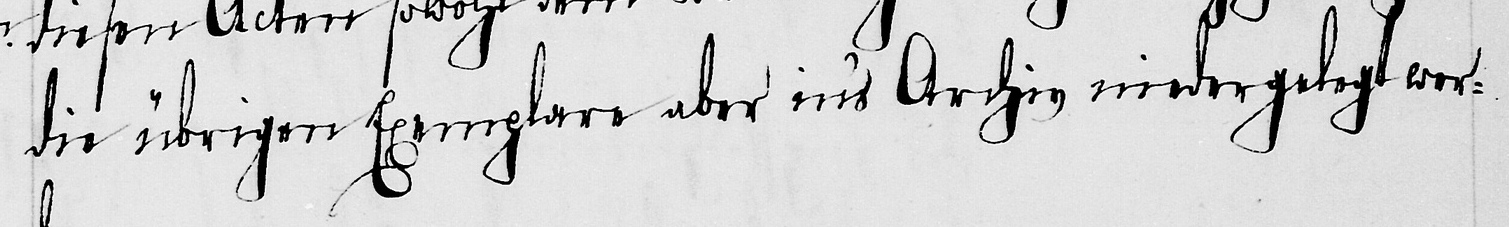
die übrigen Exemplare aber in’s Archiv niedergelegt wer¬
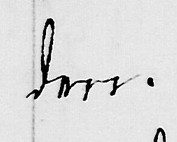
den.
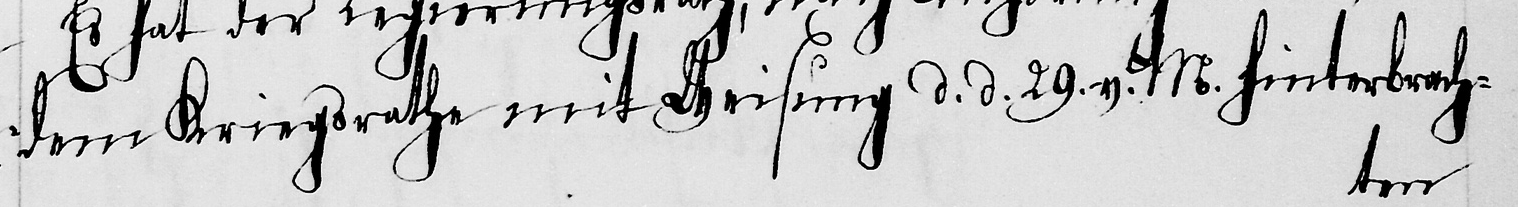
dem Kriegsrathe mit Weisung d.d. 29. v. M. hinterbrach-
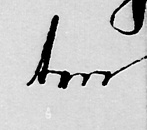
ten
